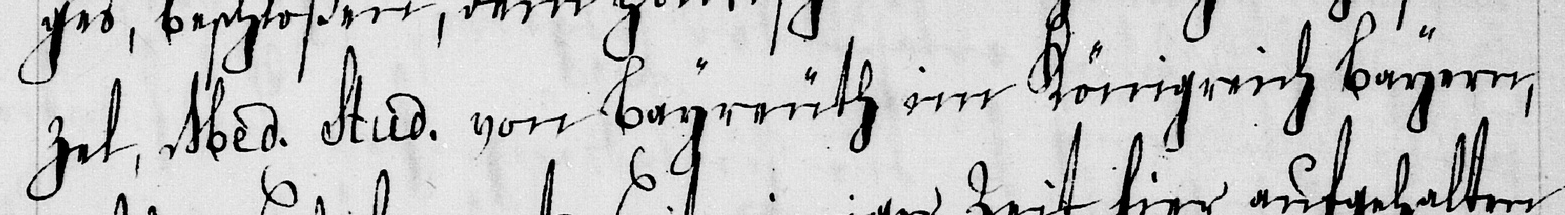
zel, Med. Stud. von Bayreuth im Königreich Bayern,
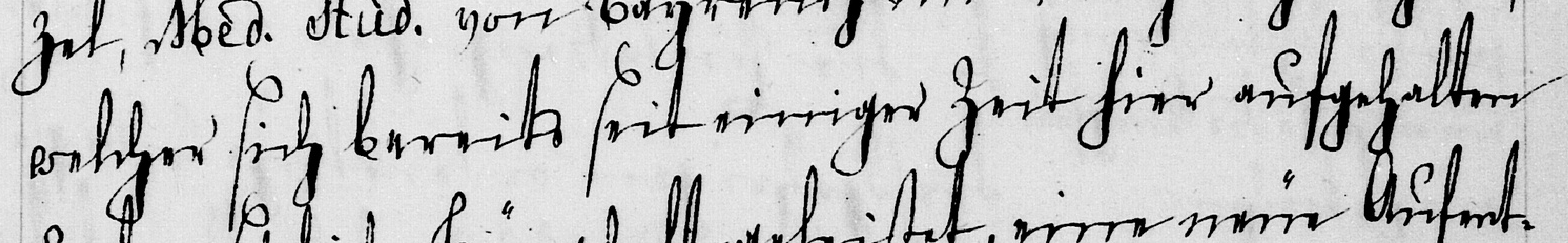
welcher sich bereits seit einiger Zeit hier aufgehalten
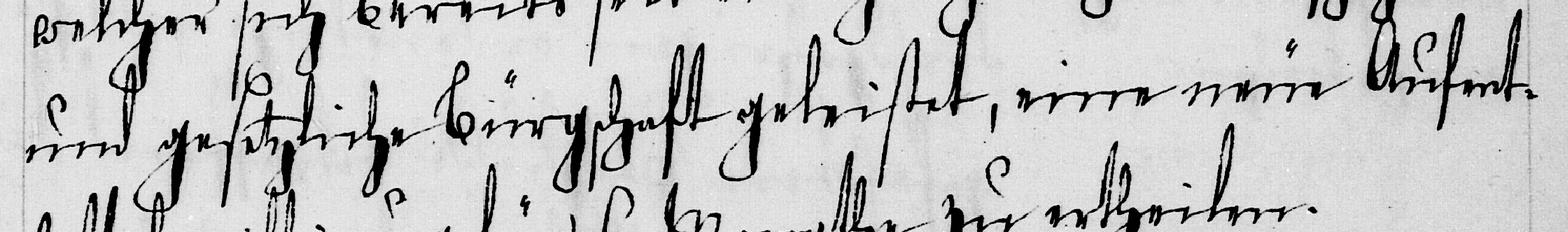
und gesetzliche Bürgerschaft geleistet, eine neue Aufent¬
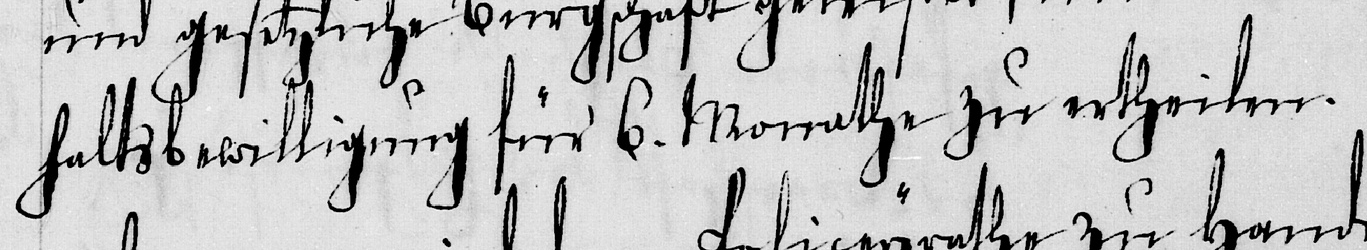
haltsbewilligung für 6. Monathe zu ertheilen.
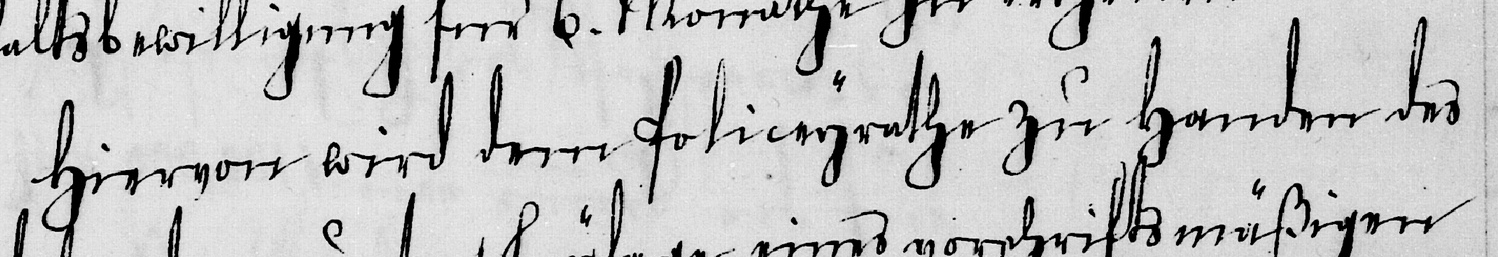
Hiervon wird dem Policeyrathe zu Handen des
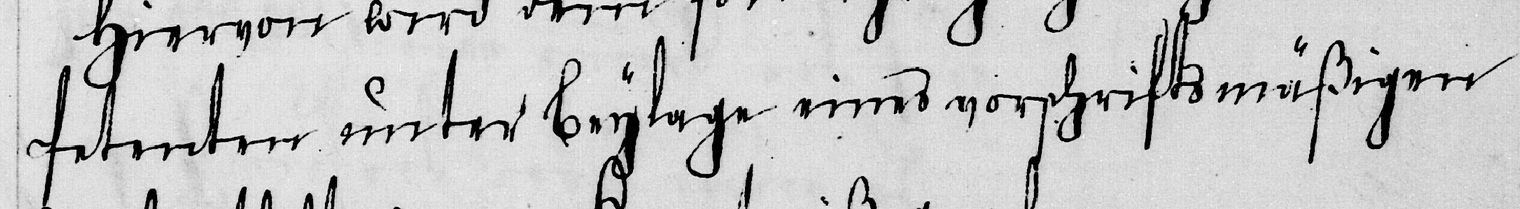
Petenten unter Beylage eines vorschriftsmäßigen
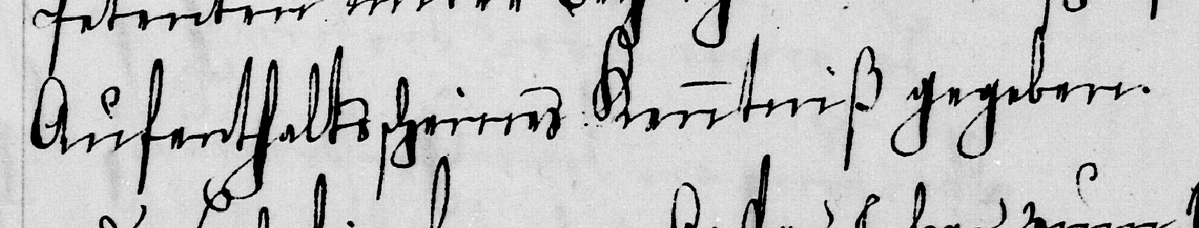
Aufenthaltsscheins Kenntniß gegeben.
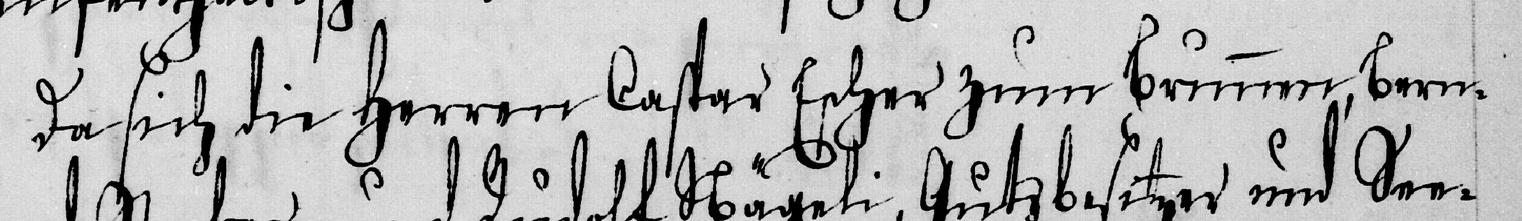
Da sich die Herren Caspar Escher zum Brunnen, Bern¬
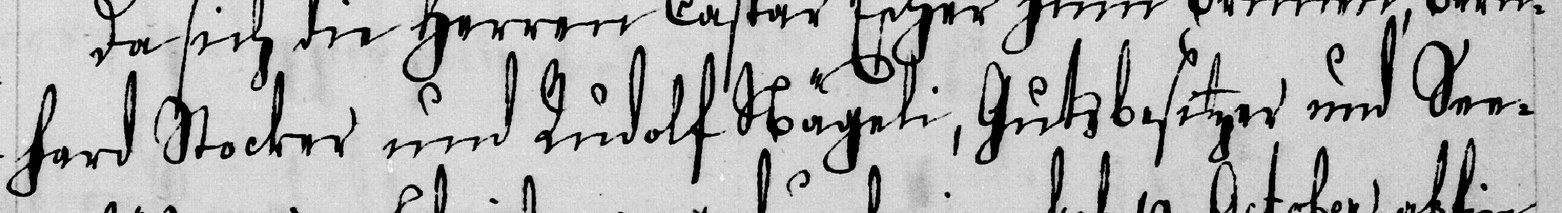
hard Stocker und Rudolf Nägeli, Gutsbesitzer und See¬
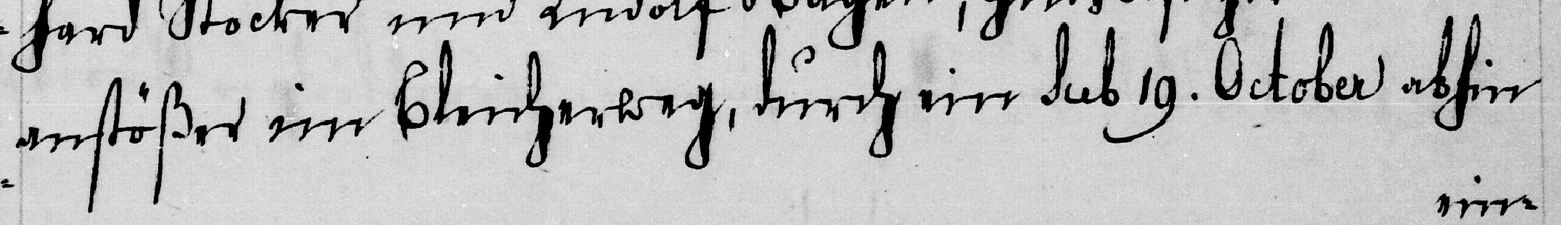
anstößer im Bleicherweg, durch ein sub 19. October abhin
